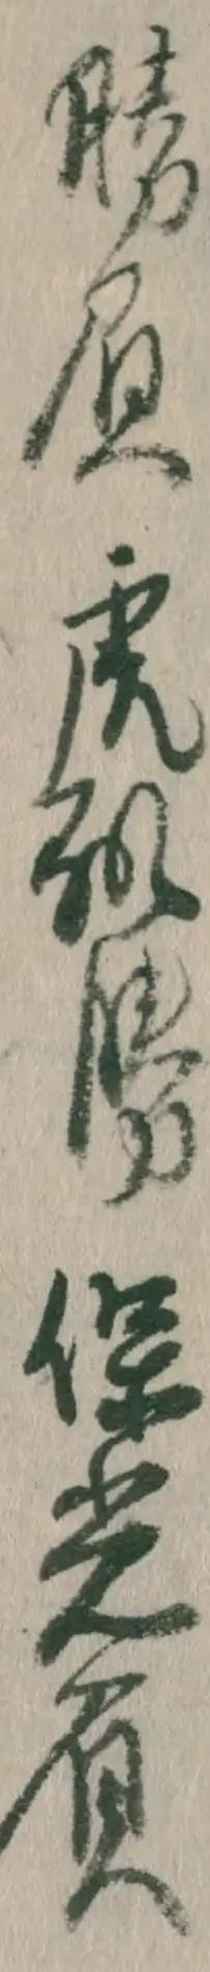勝負虎顕勝保光負
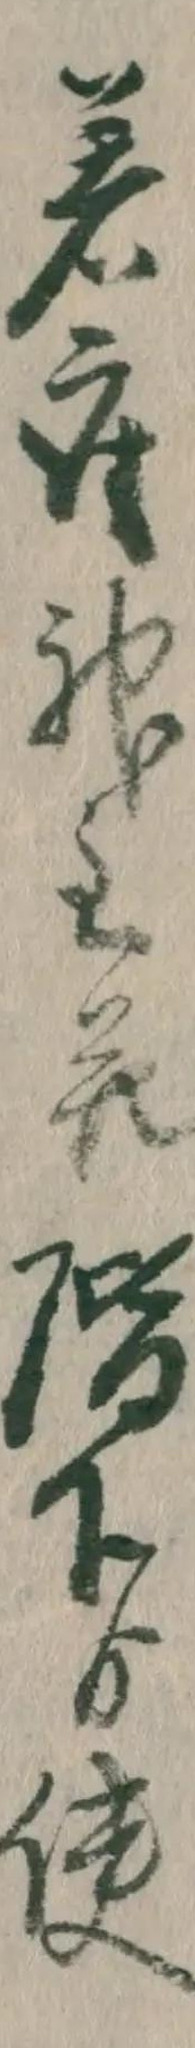着座神主并階下ゟ使
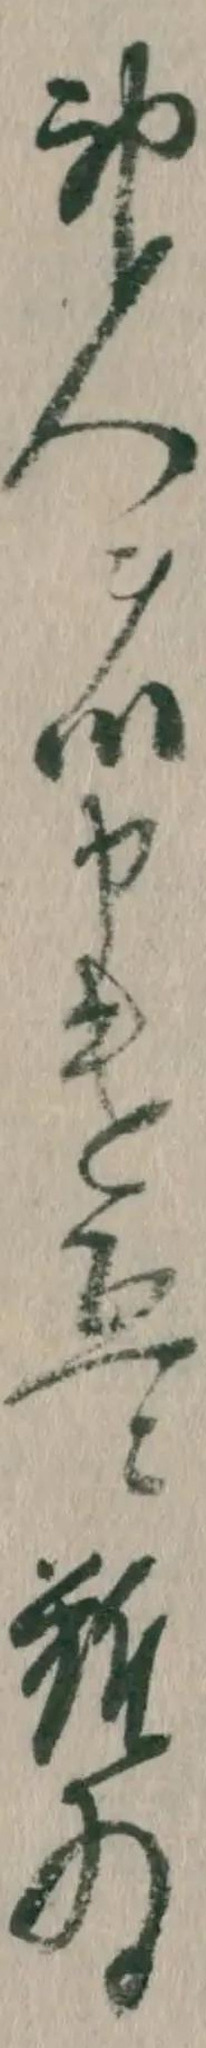神人ヲ以申遣互ニ難為
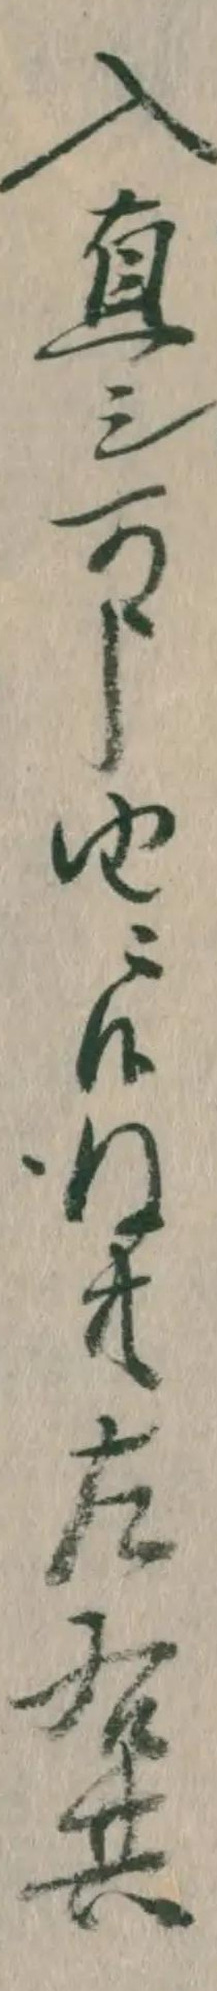入直シ可申由ニ候得共左右共
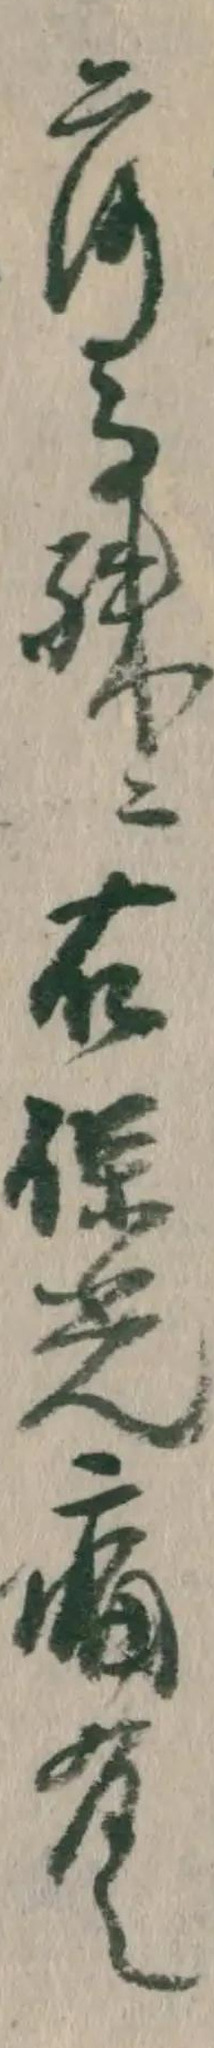落馬殊ニ右保光痛有之
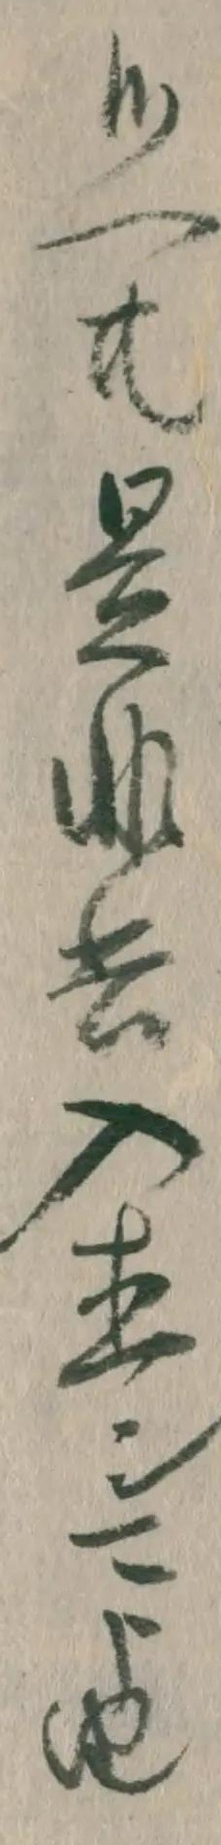候へ共是非共入直シ可申由
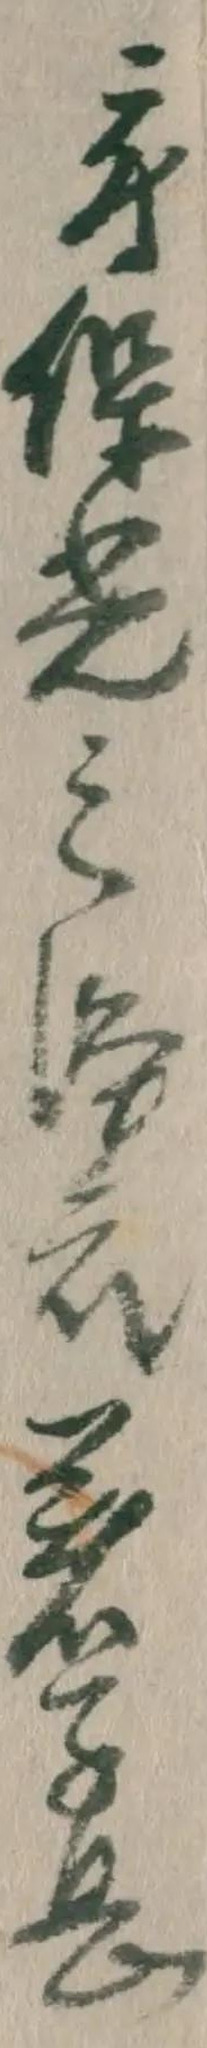ニ付保光之浄衣着子息
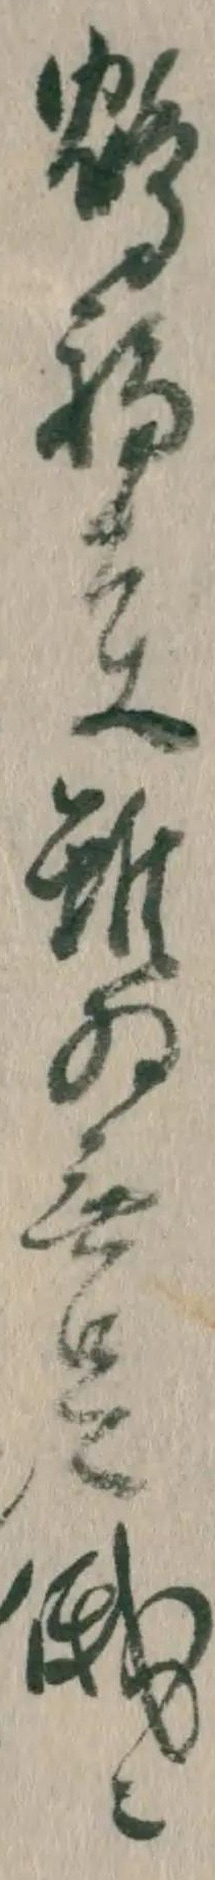鶴福大夫難為無足俄ニ
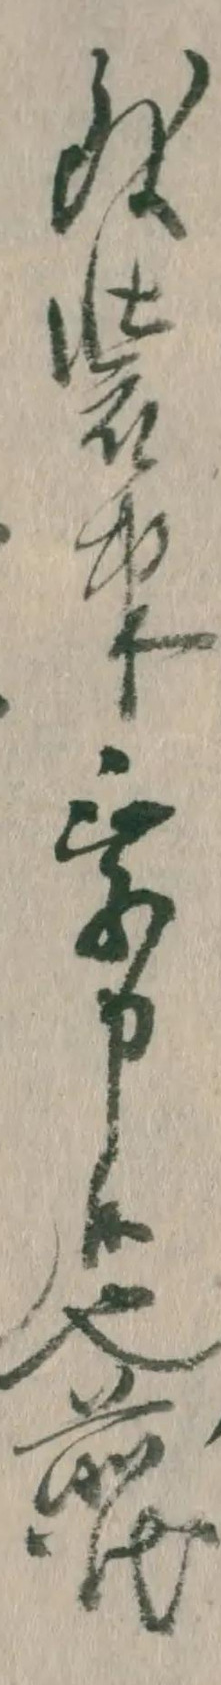改装束乗申候也前代
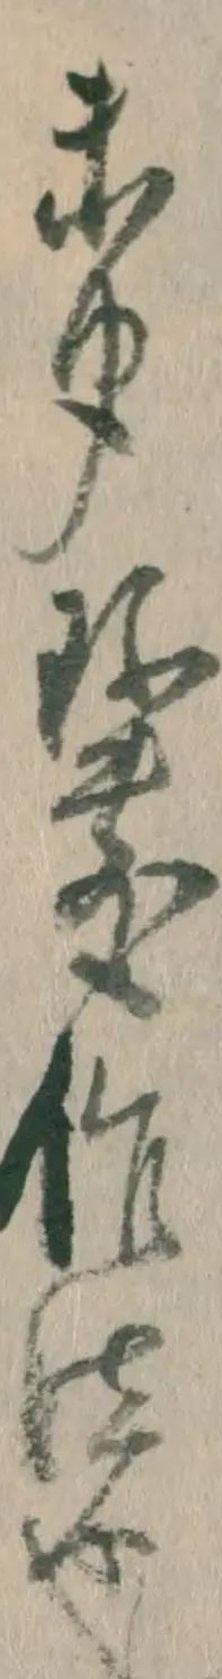未聞珍敷作法也
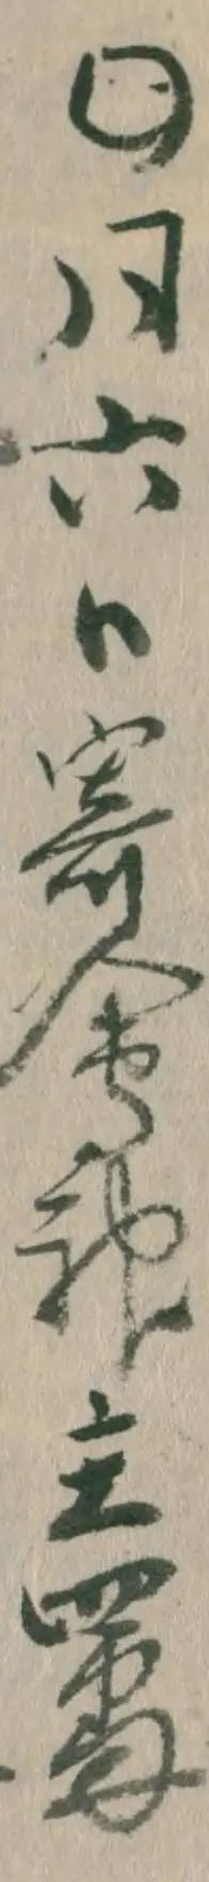○月六日寄会神主四番
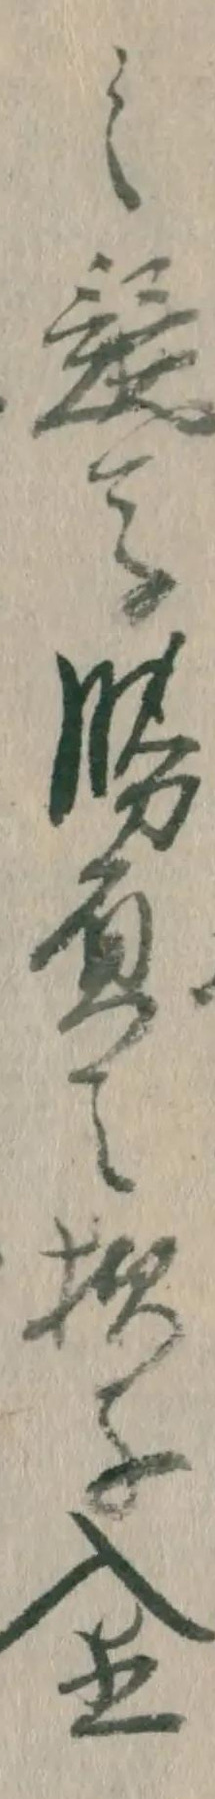之競馬勝負之様子入直
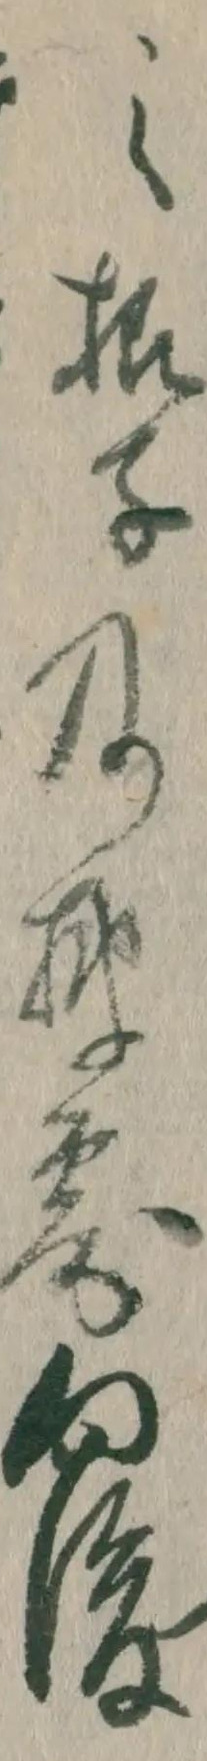之様子及披露向後
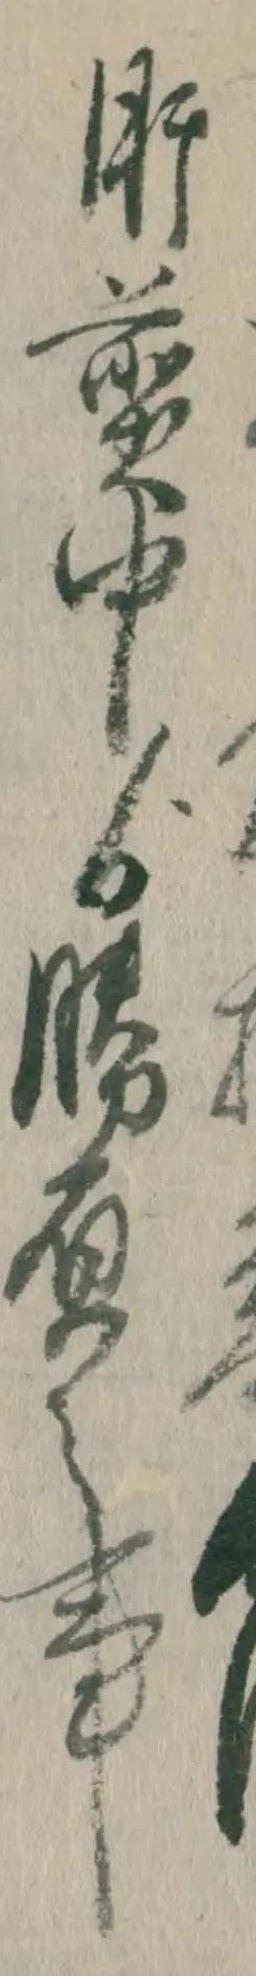肝煎中ゟ勝負之事
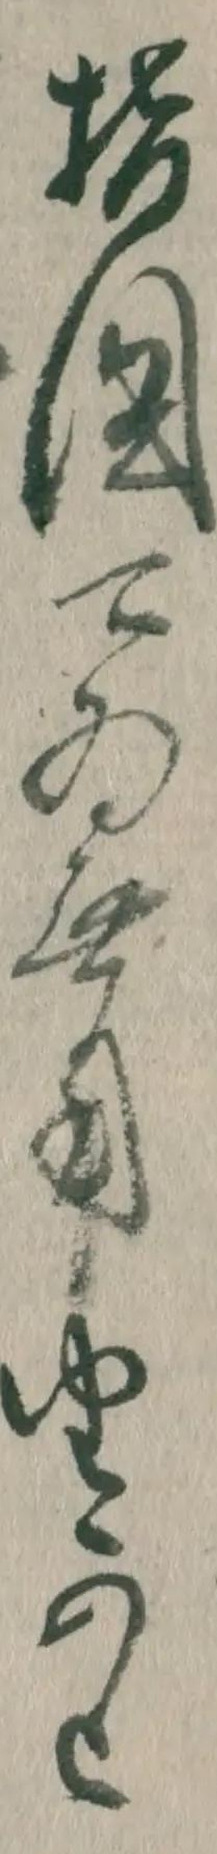指図可為無用由可被
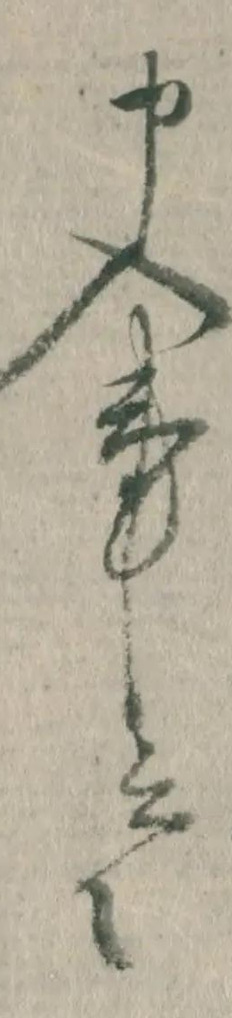申入事云々
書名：賀茂社記録. 第10冊
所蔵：国立国会図書館 National Diet Library, JAPAN
